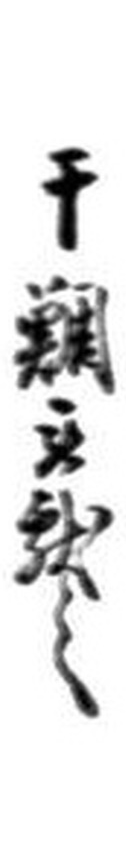干鯛被献之

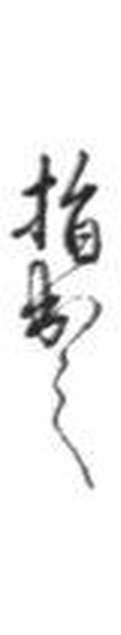指出之
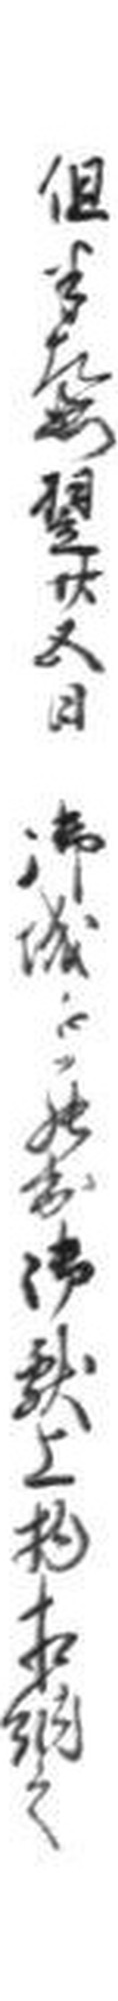但半左衛門翌廿五日御城江罷出御献上物相納之
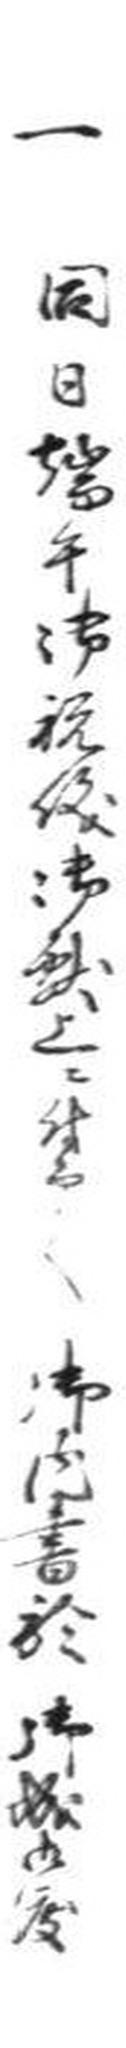一同日端午御祝儀御献上ニ付而之御内書於御城御渡
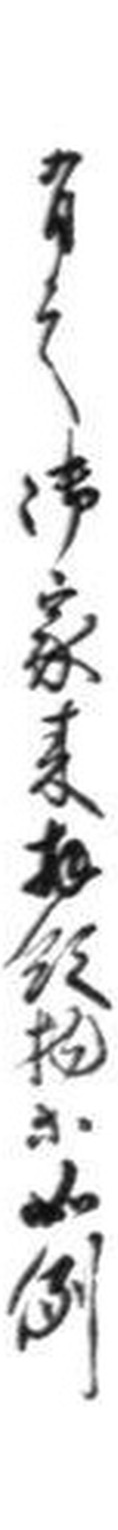有之御家来拝領物等如例
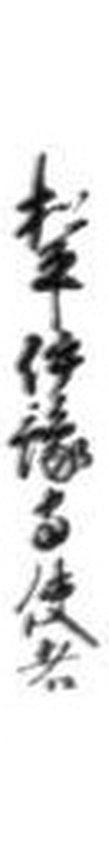松平伊予守使者
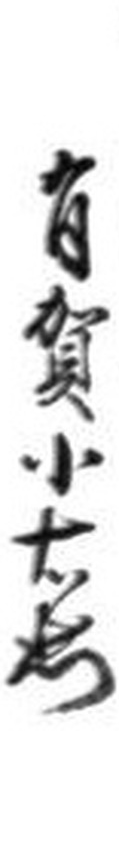有賀小右衛門
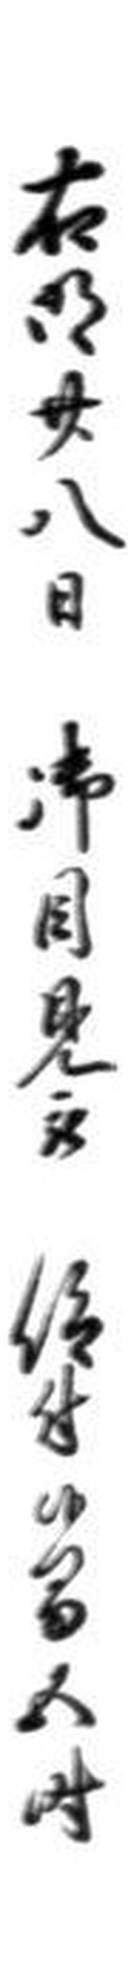右明廿八日御目見被仰付候間五時
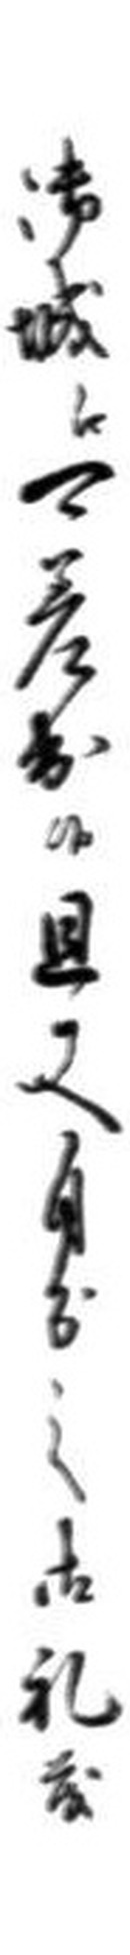御城江可差出候且又自分之御礼茂
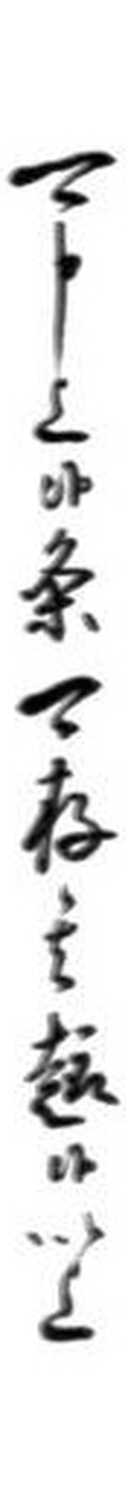可申上候条可存其趣候以上
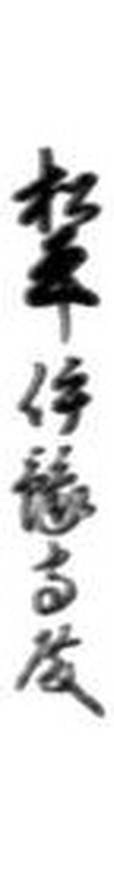松平伊予守殿
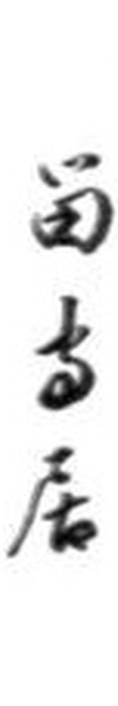留守居
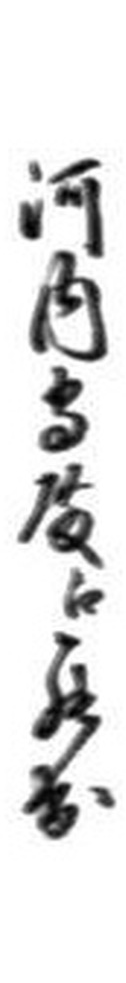河内守殿江罷出
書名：家譜 三十二 吉邦公 従享保二年到享保三年
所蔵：福井県文書館 Fukui Prefectural Archives
